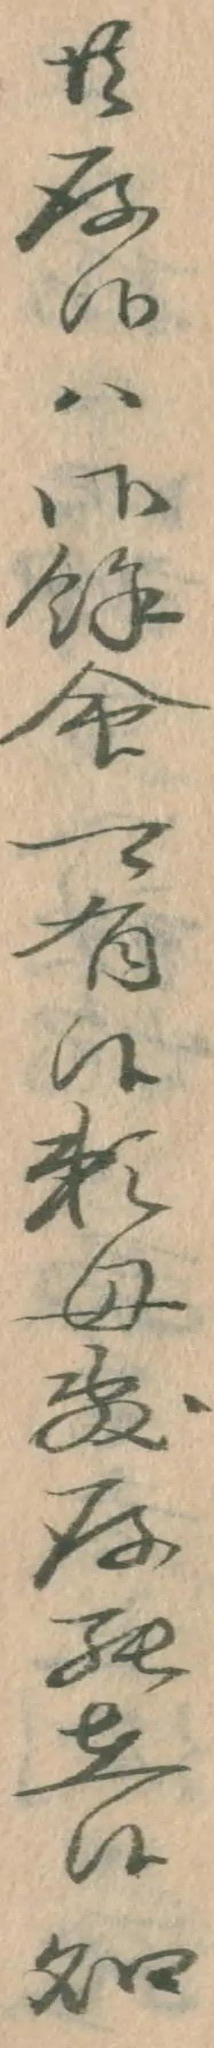共存候は御余命可有候頼母敷存罷在候処

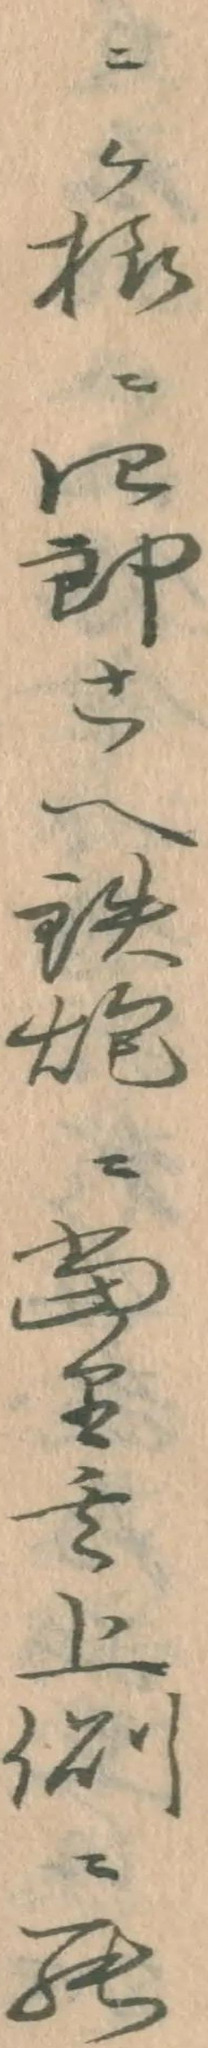にけ様に四郎さへ鉄砲に当里其上倒に罷
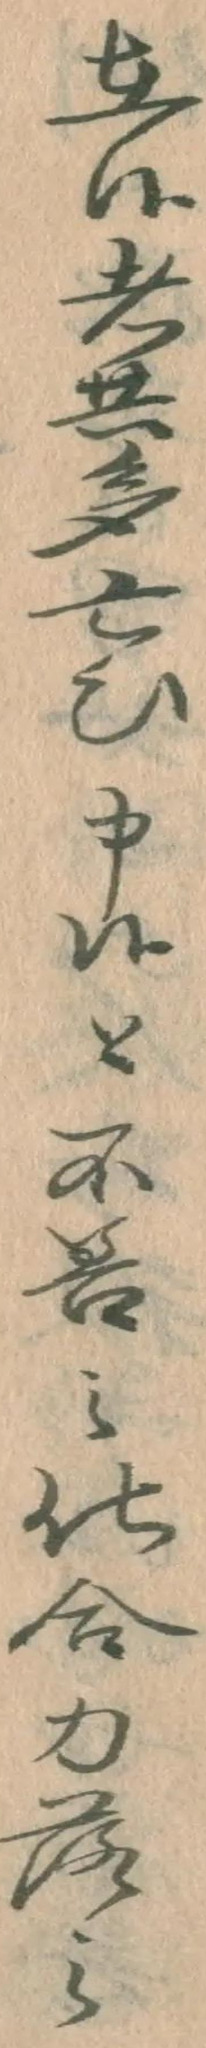在候者共多亡ひ申候と不善之仕合力落之
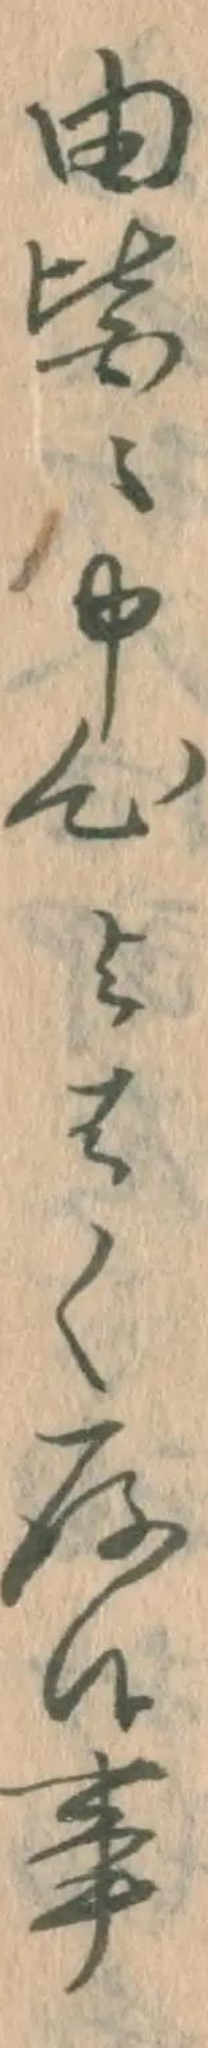由皆々申心与者〱存候事
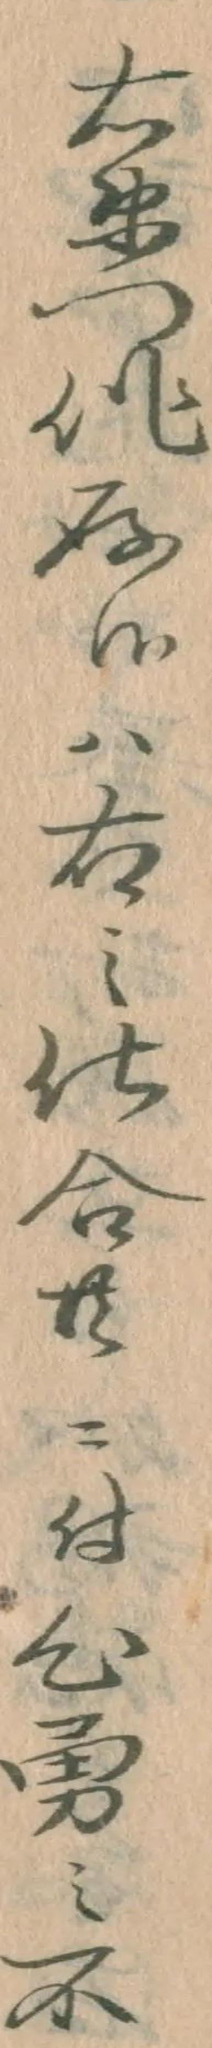一右衛門作存候は右之仕合共に付心勇之不
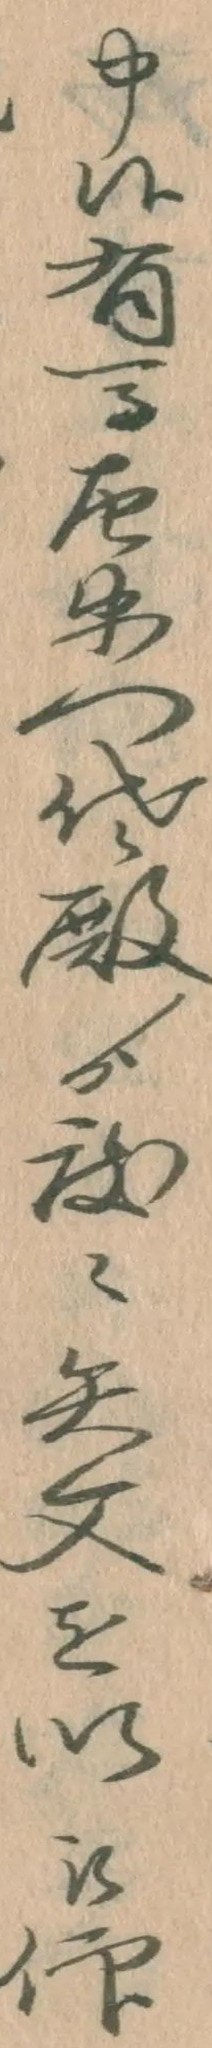申候有馬左衛門佐殿ゟ度々矢文を以被仰
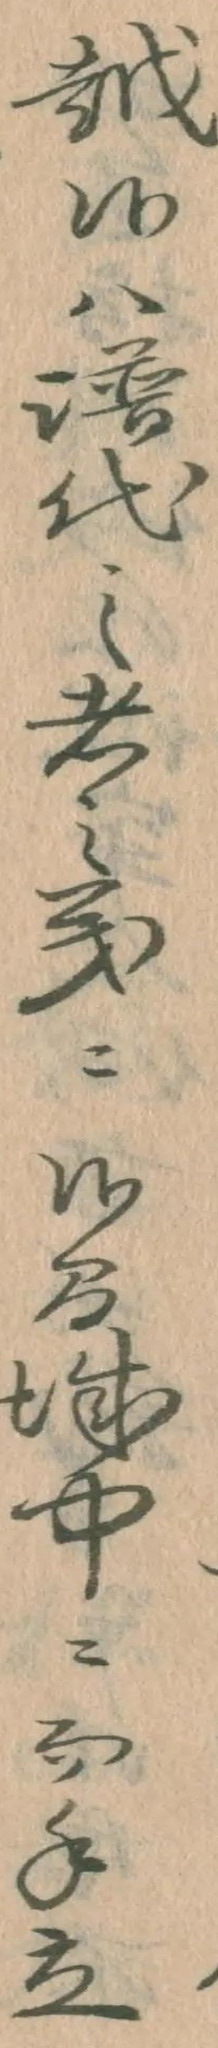越候は譜代之者之義に候間城中に而手立
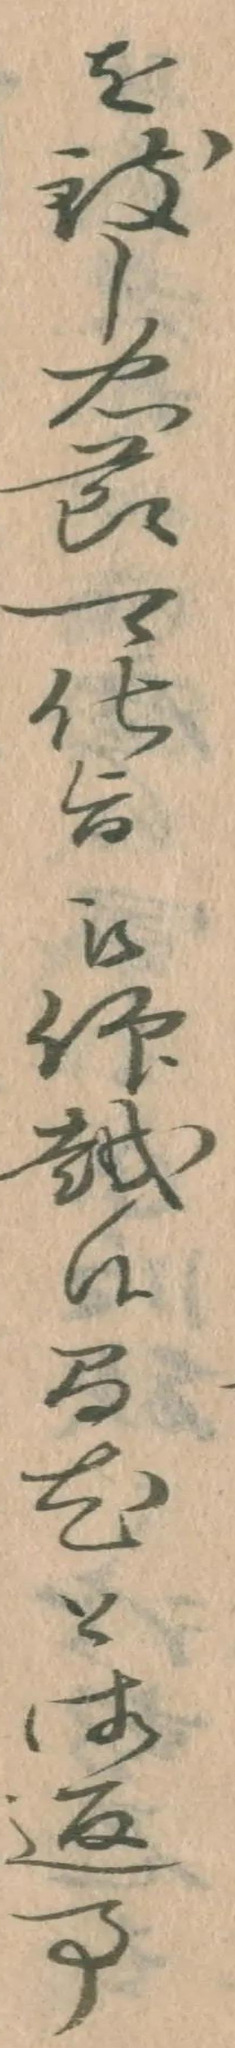を致し忠節可仕旨被仰越候間尤と御返事
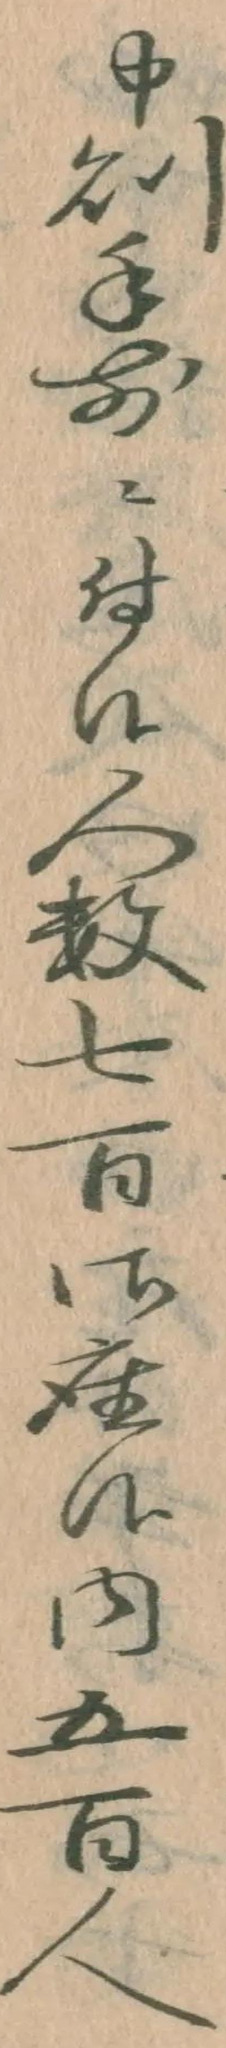申則手前に付候人数七百御座候内五百人
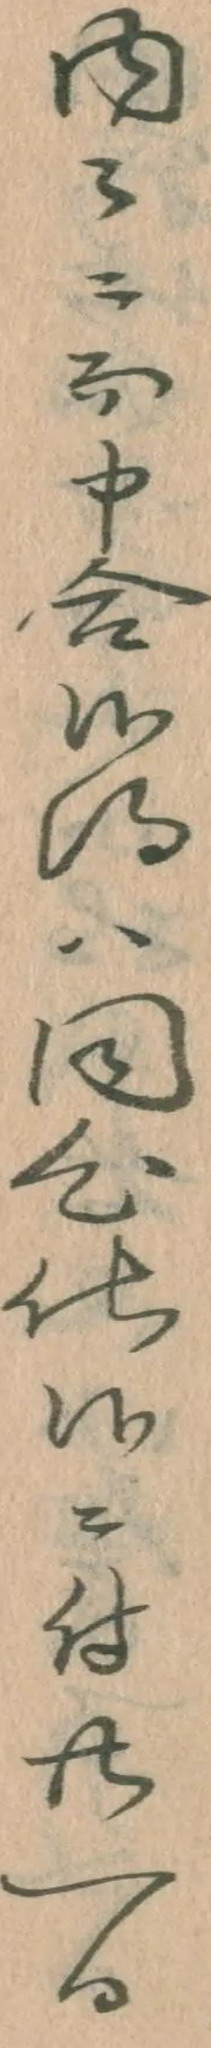内々に而申合候得は同心仕候に付廿一日
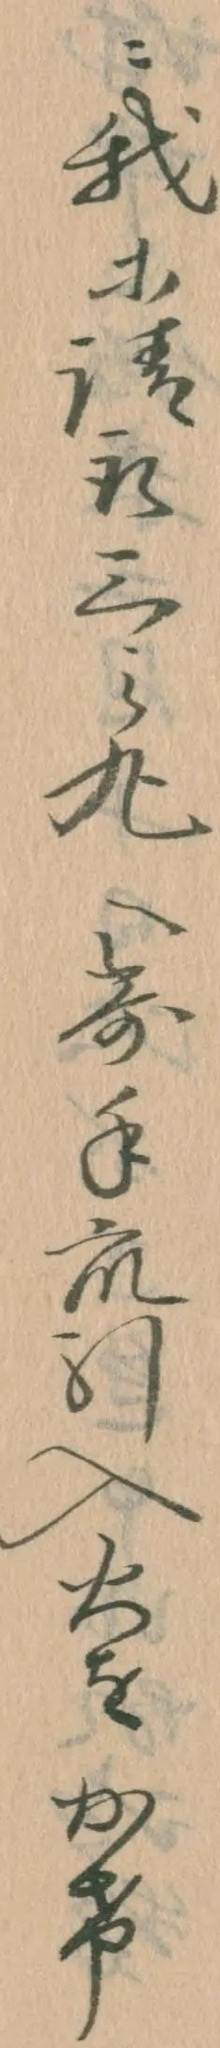に我等請取三之丸へ寄手衆引入火をか希
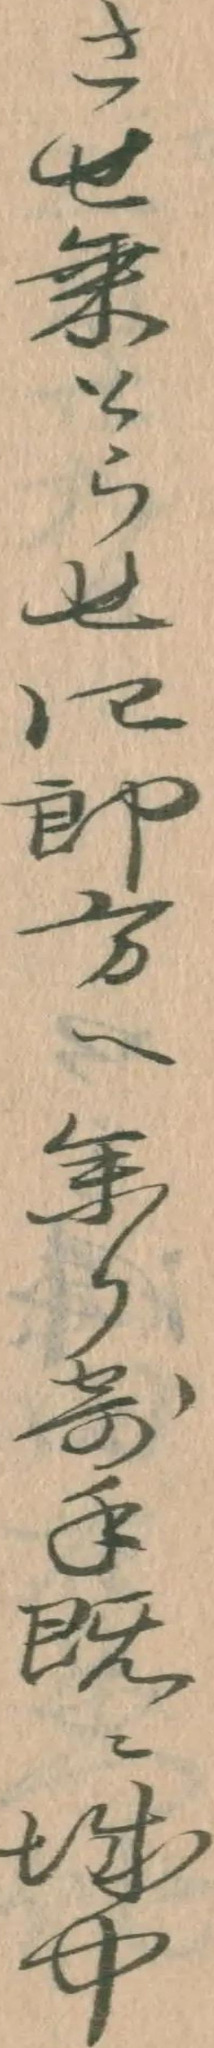させ乗とらせ四郎方へ参り寄手既に城中
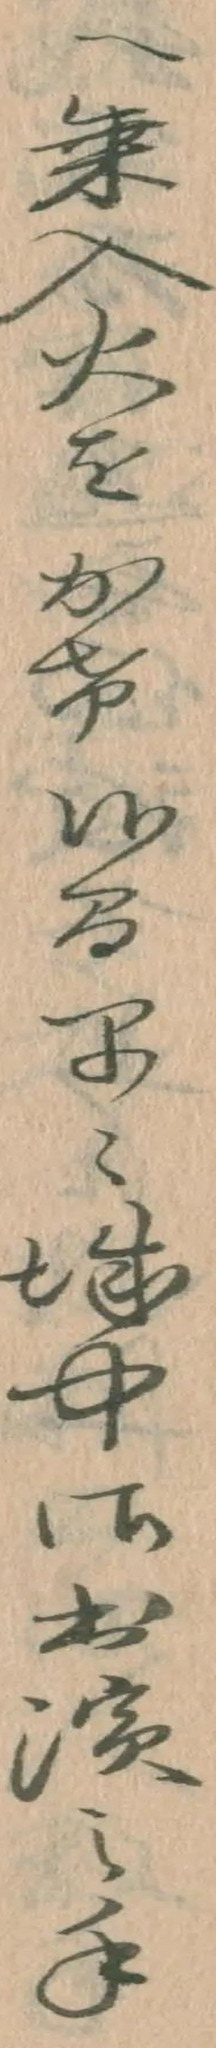へ乗入火をか希候間早々城中御出浜之手
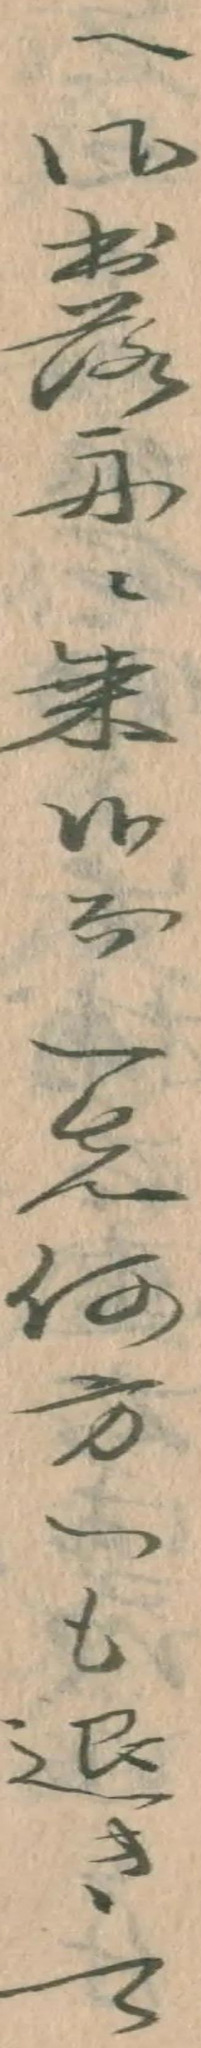へ御出落舟に乗候而一先何方へも退き可
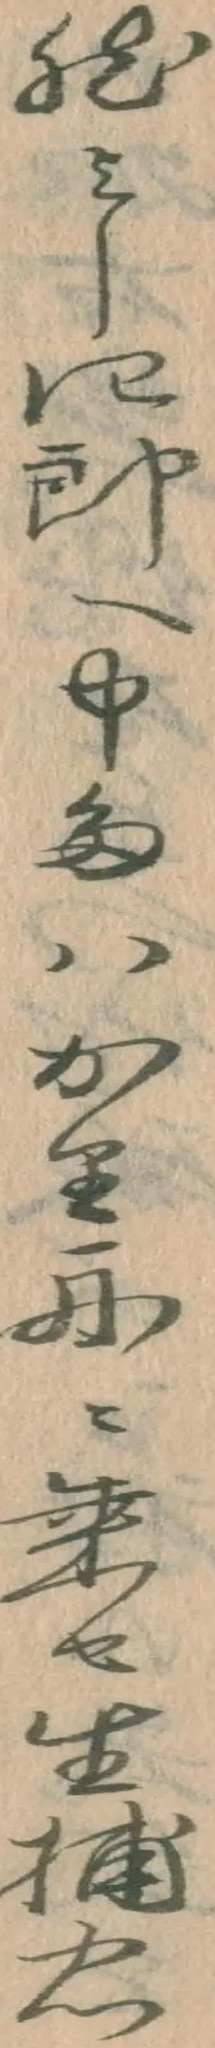然与し四郎へ申多はか里舟に乗せ生捕忠
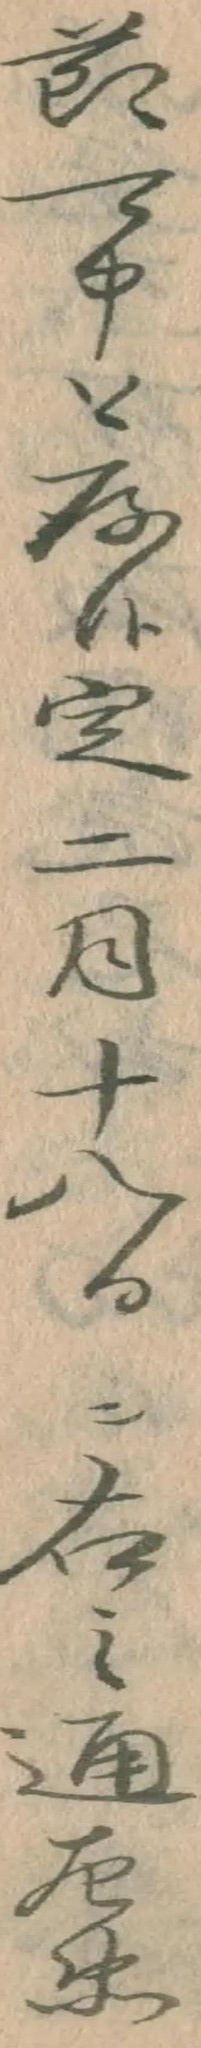節可申と存候定二月十八日に右之通左衛
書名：切支丹御退治記 49巻. [9]
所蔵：国立国会図書館 National Diet Library, JAPAN
